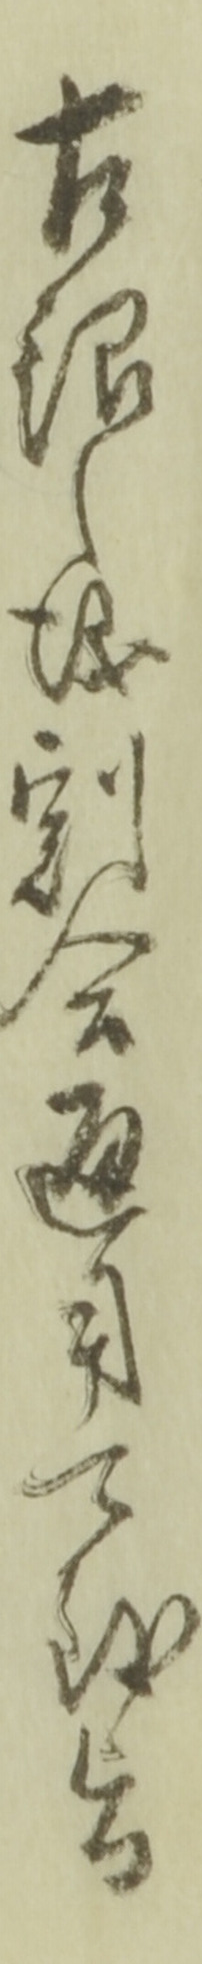古銀之儀割合通用可致旨
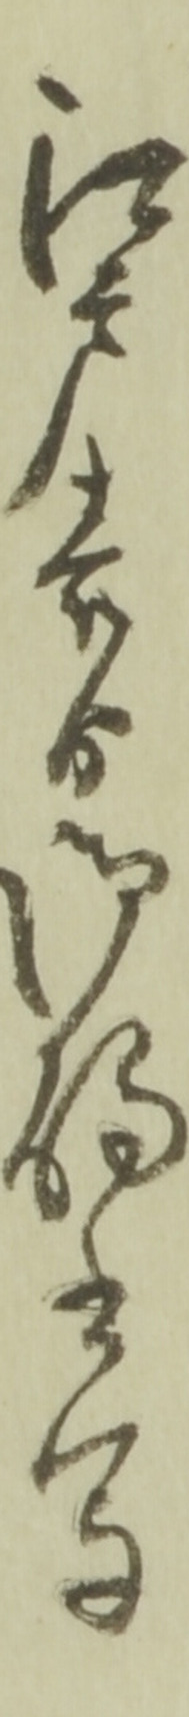江戸表より御触書写
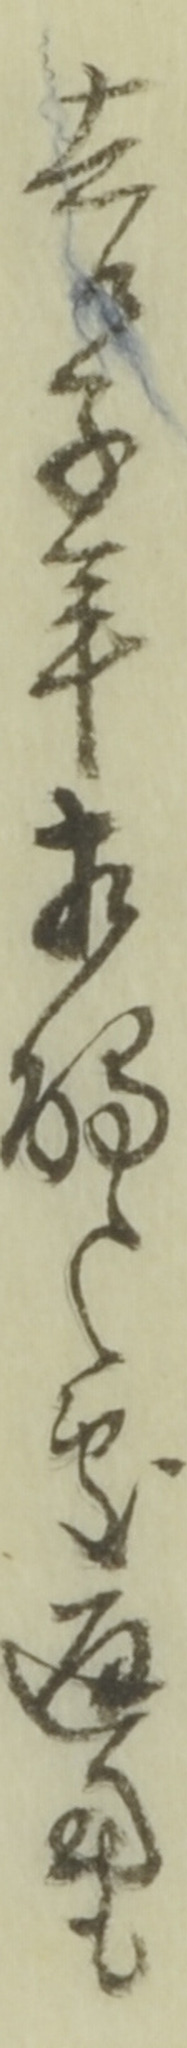去子年相触候處通用も
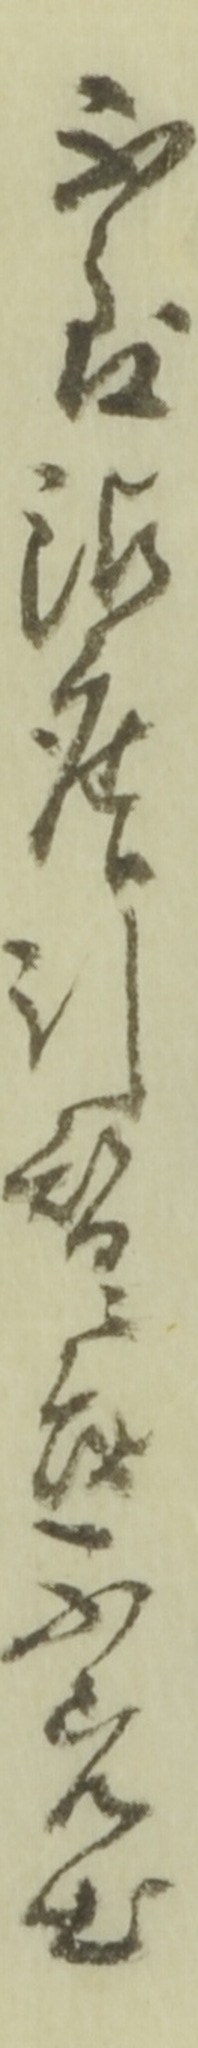不致銀座引替二茂不差出
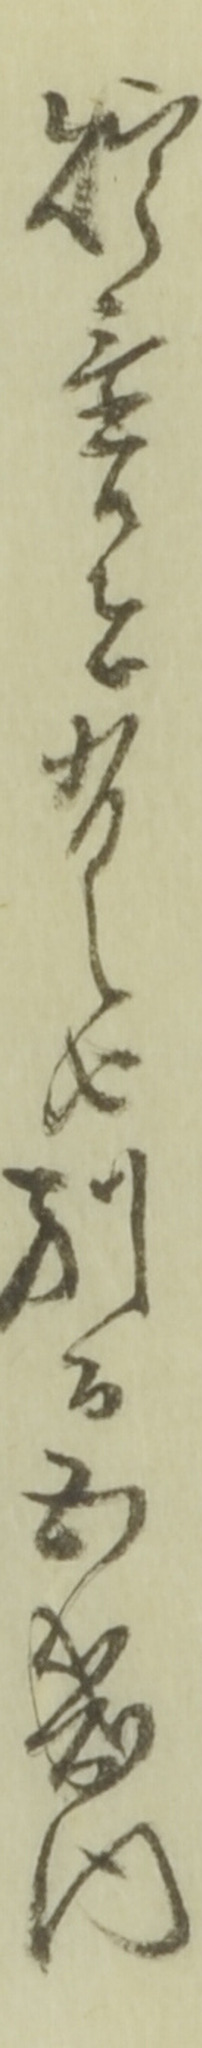貯置候者有之候別而五畿内
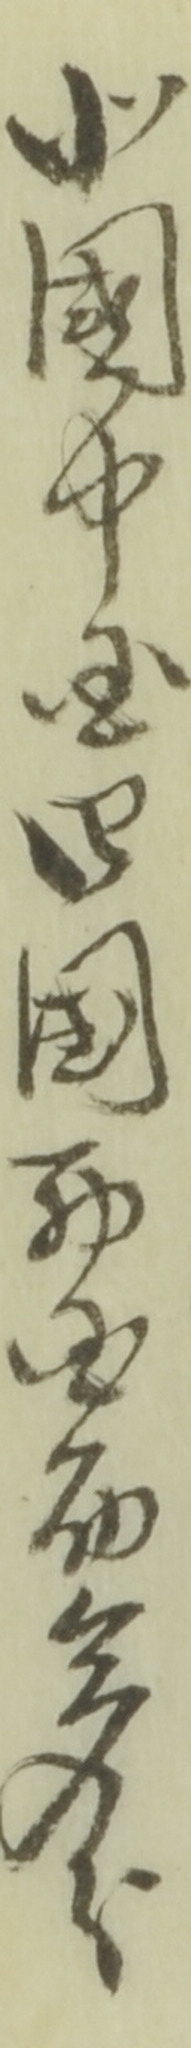北国中国四国西国筋多分
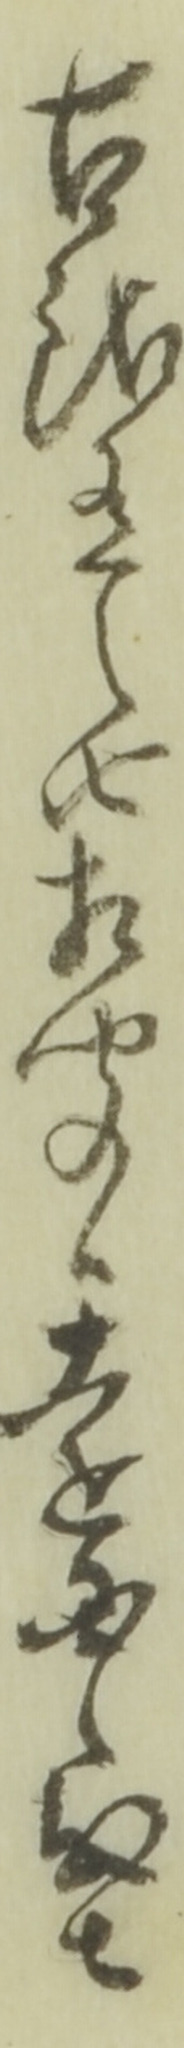古銀有之由相聞候遠国候義者
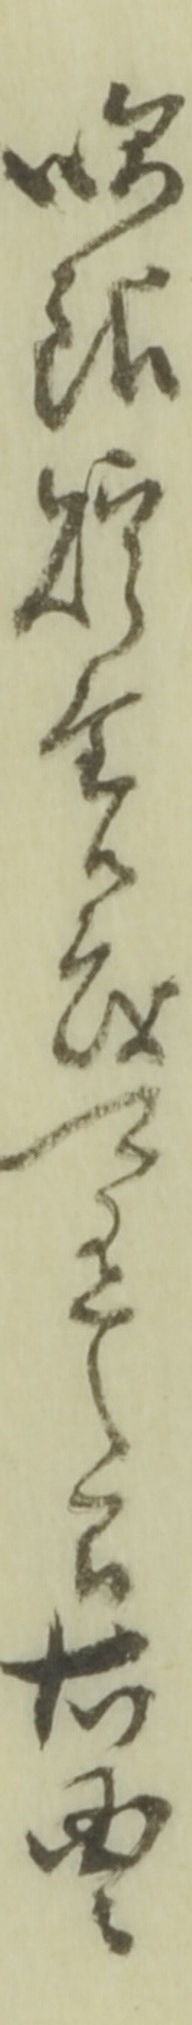吹銀貯金候茂可有之候間右国之
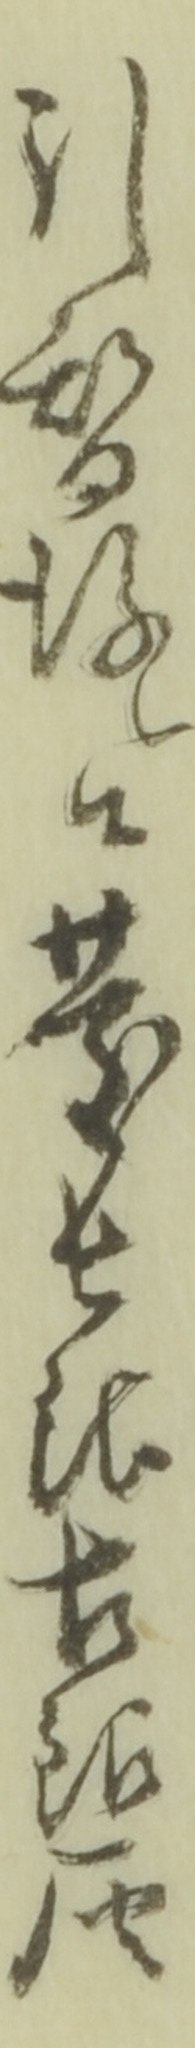引替後候而慶長銀古銀灰
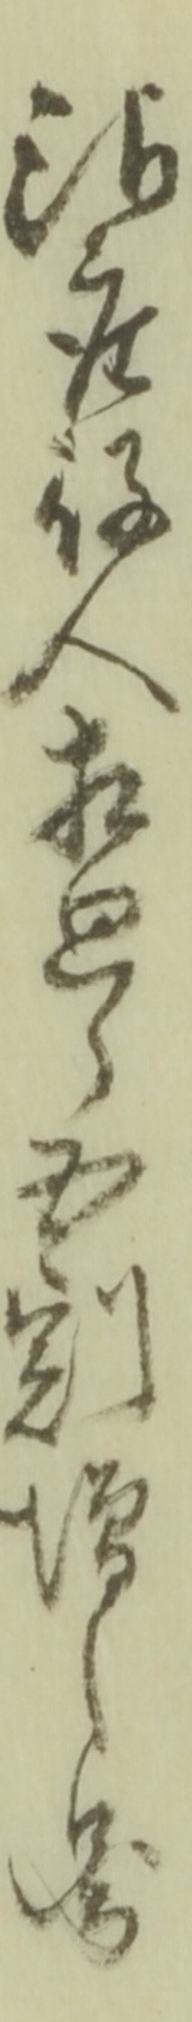銀座役人相廻し五割増候国
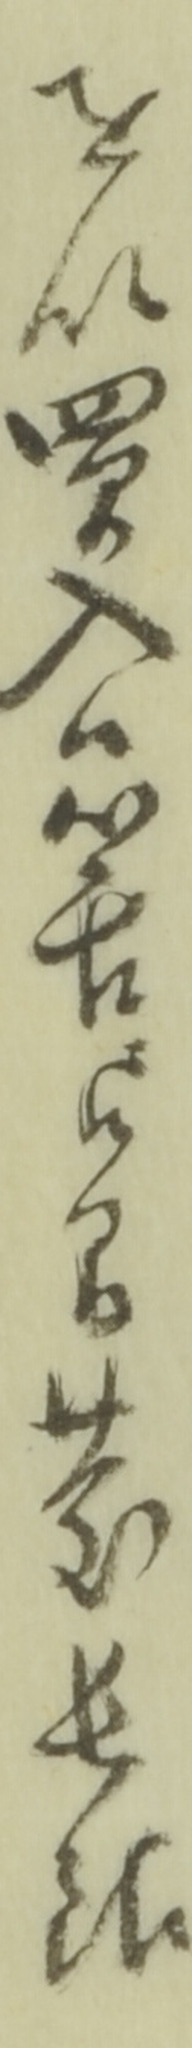を以買入候筈二候間慶長銀
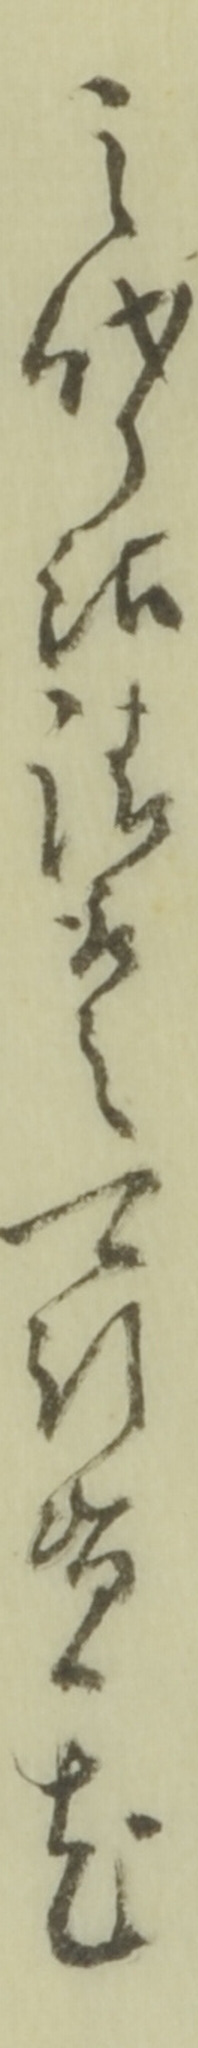之代り銀請取候て可引替候尤
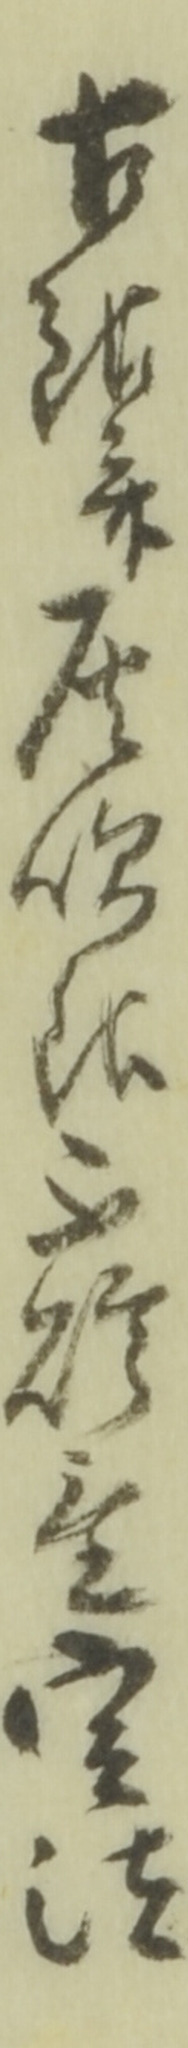古銀並灰吹銀不貯置定法
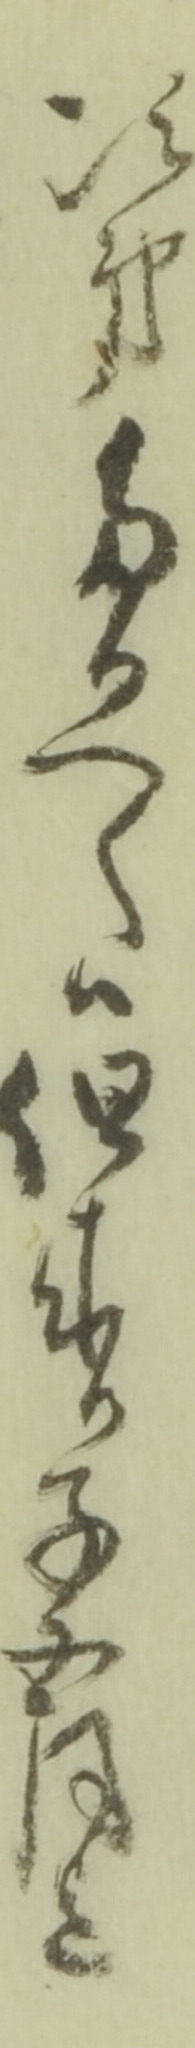次第たるべく候但来る子五月迄
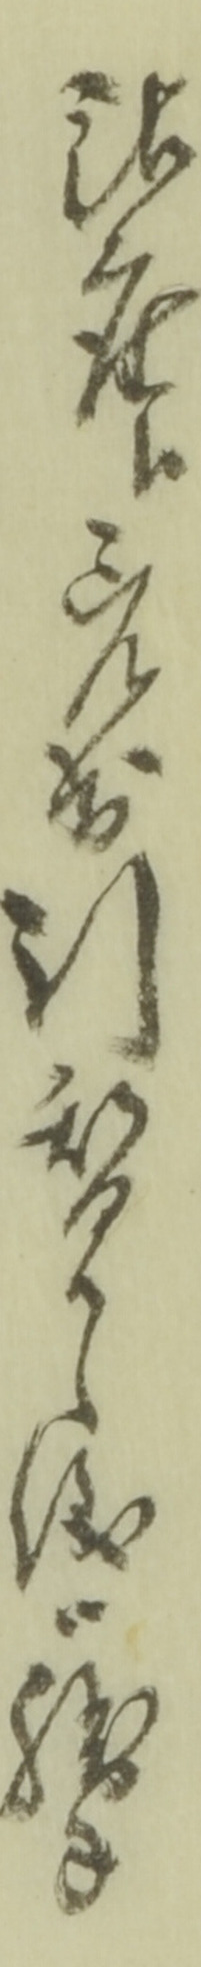銀座江差出引替候儀ハ勝手
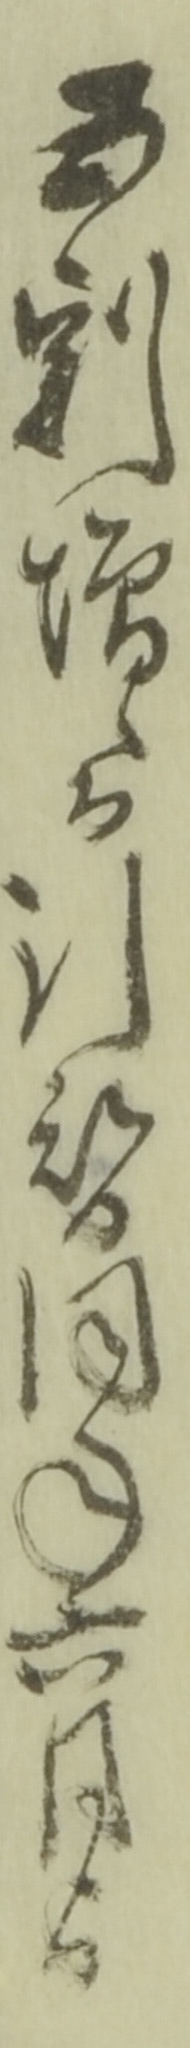当割増候而引替同年六月より
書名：御公儀様御領主様御触書控
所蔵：伊那市立高遠町図書館・合同会社AMANE
